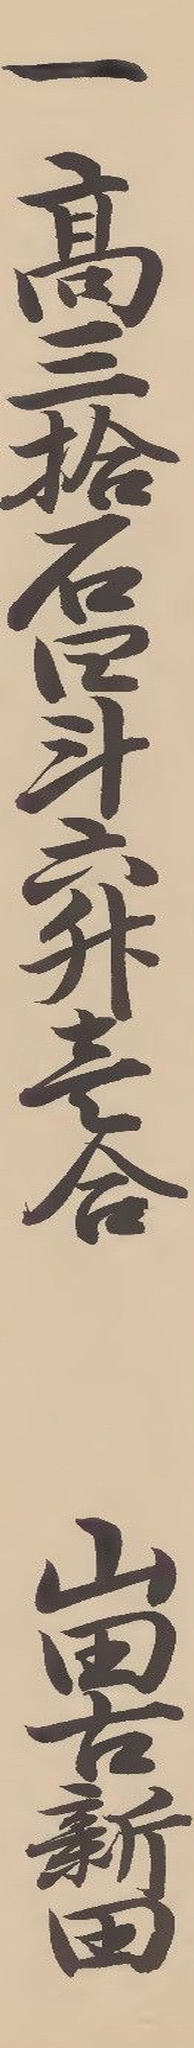一高三拾石四斗六升壱合山田古新田
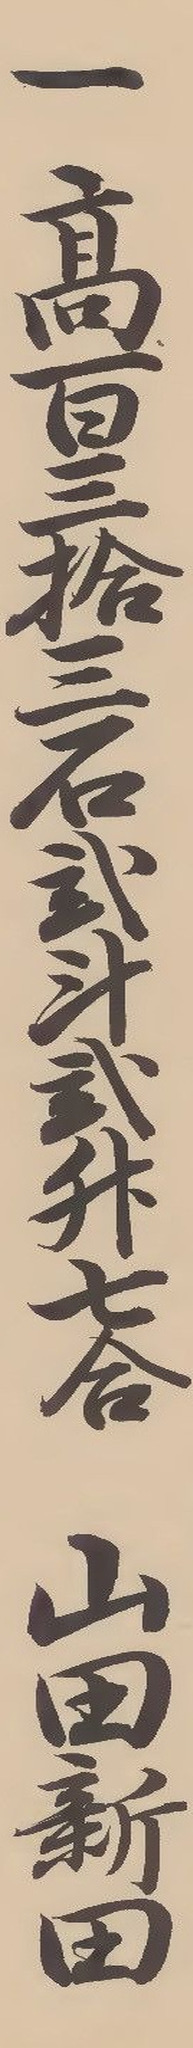一高百三拾三石弐斗弐升七合山田新田
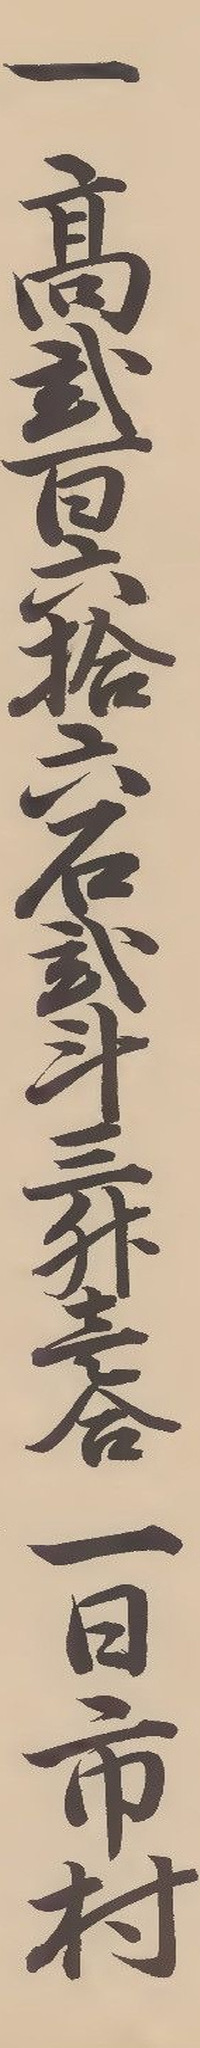一高弐百六拾六石弐斗三升壱合一日市村
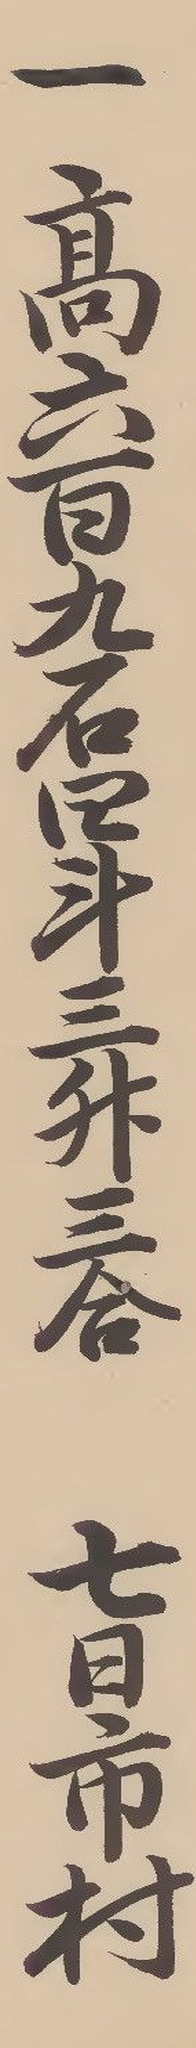一高六百九石四斗三升三合七日市村

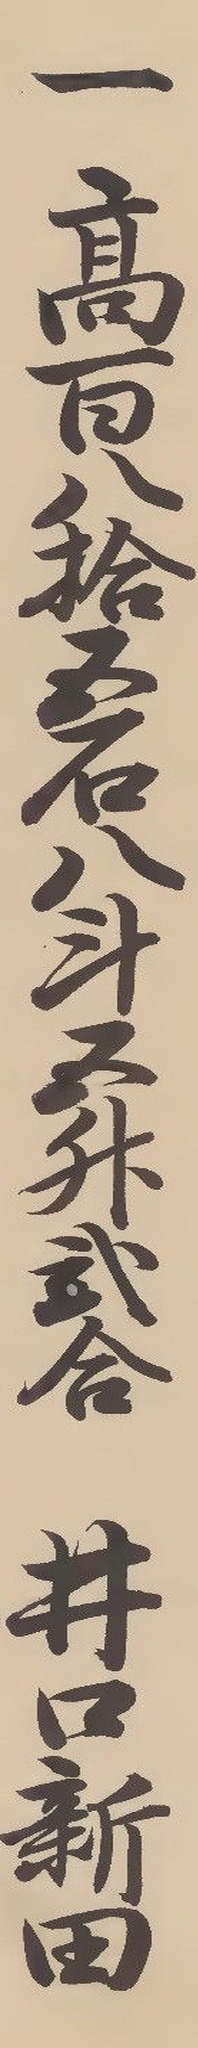一高百八拾五石八斗五升弐合井口新田
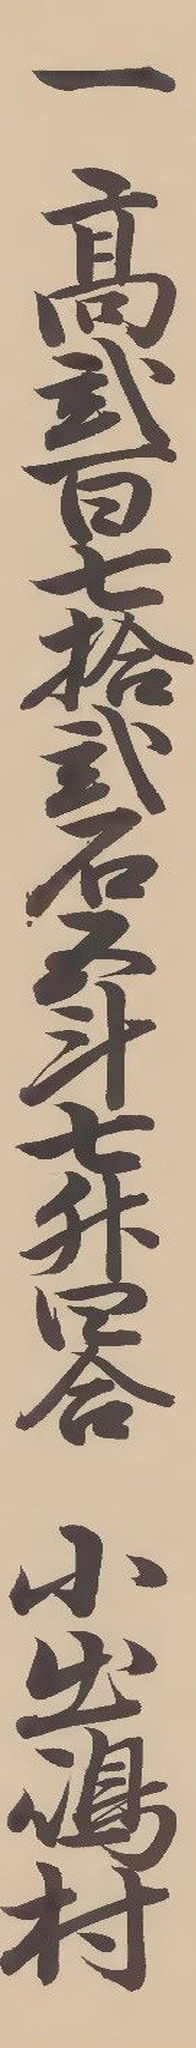一高弐百七拾弐石五斗七升四合小出島村
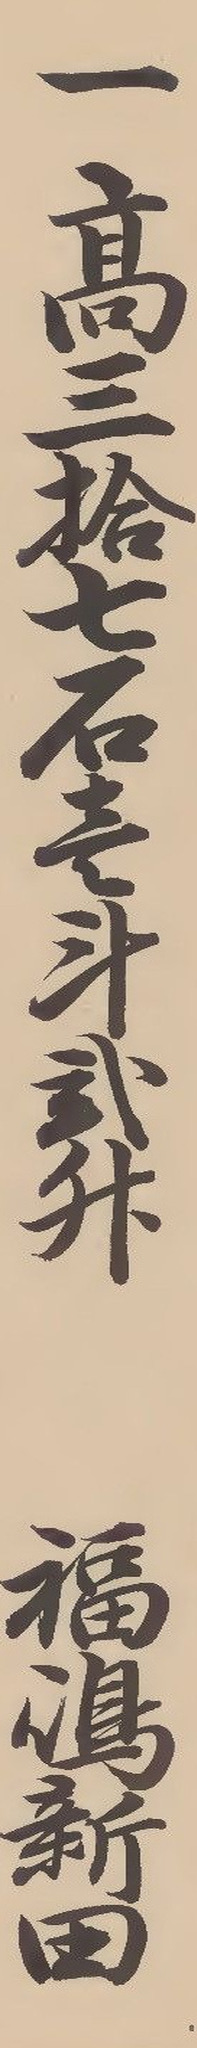一高三拾七石壱斗弐升福島新田
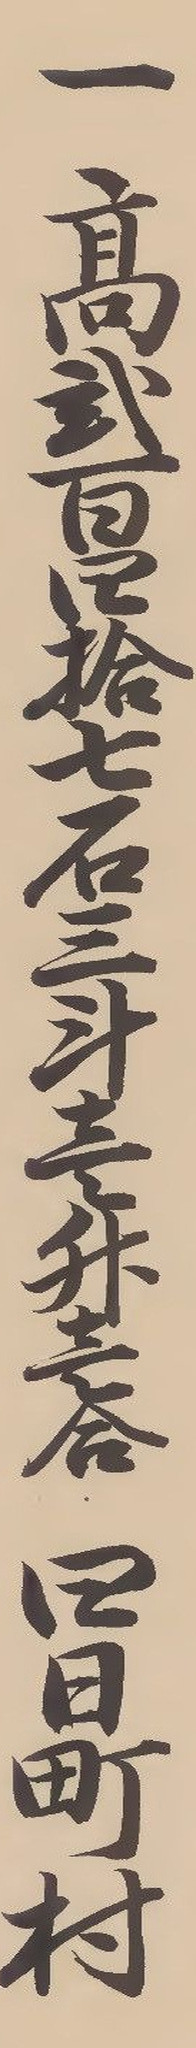一高弐百四拾七石三斗壱升壱合四日町村
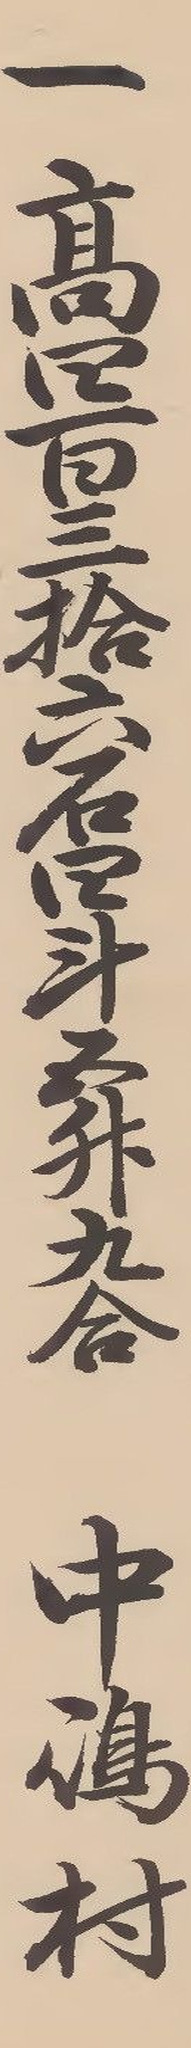一高四百三拾六石四斗五升九合中島村
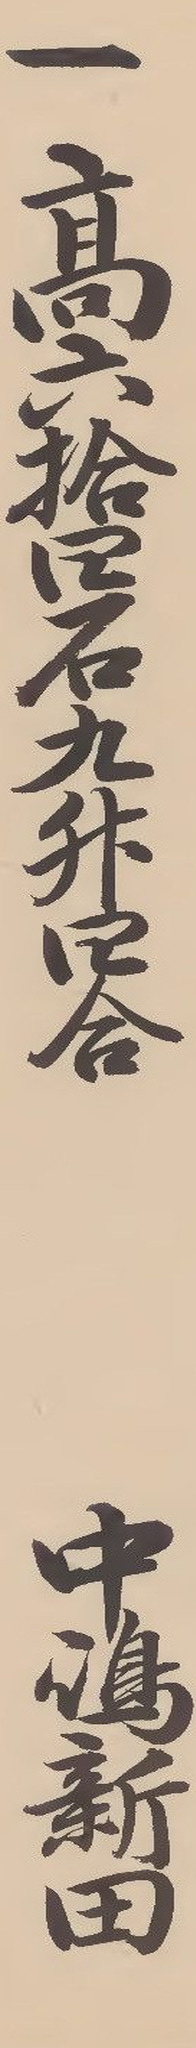一高六拾四石九升四合中島新田
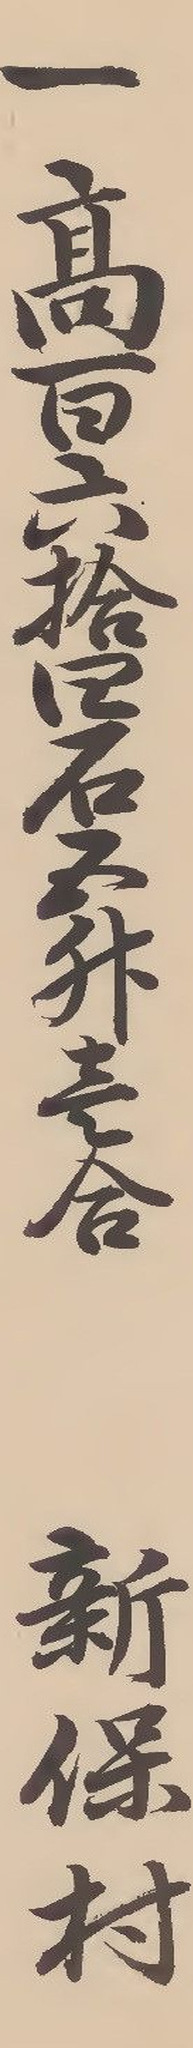一高百六拾四石五升壱合新保村
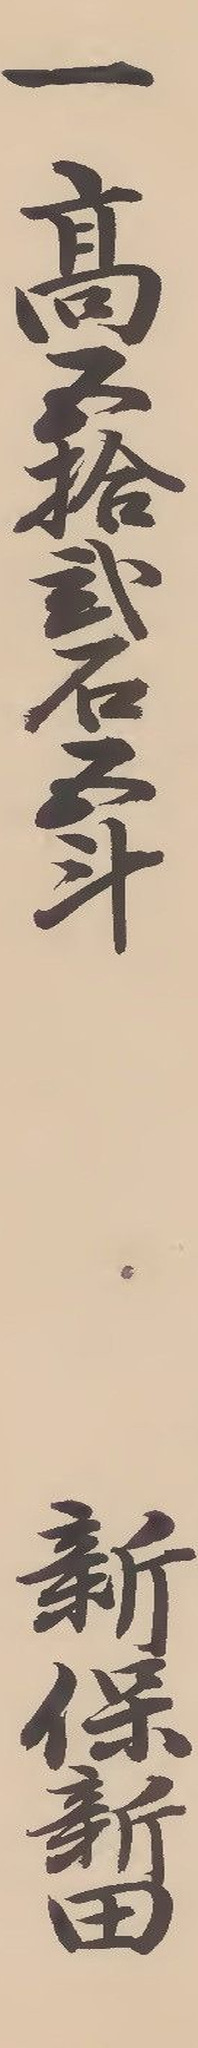一高五拾弐石五斗新保新田

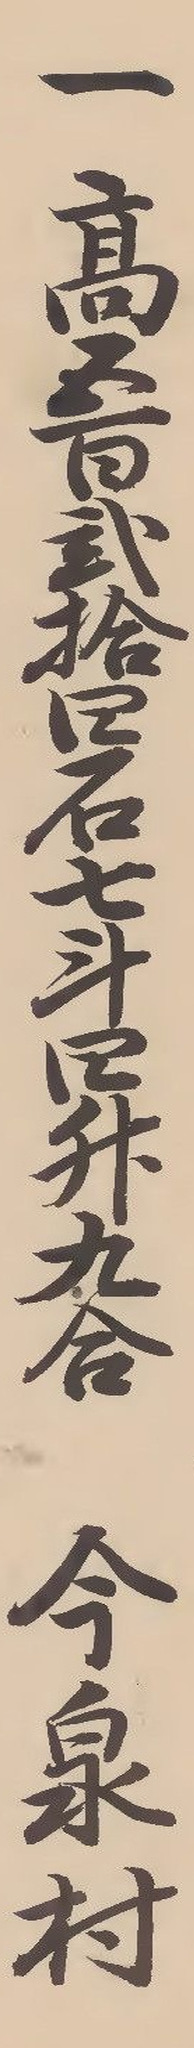一高五百弐拾四石七斗四升九合今泉村
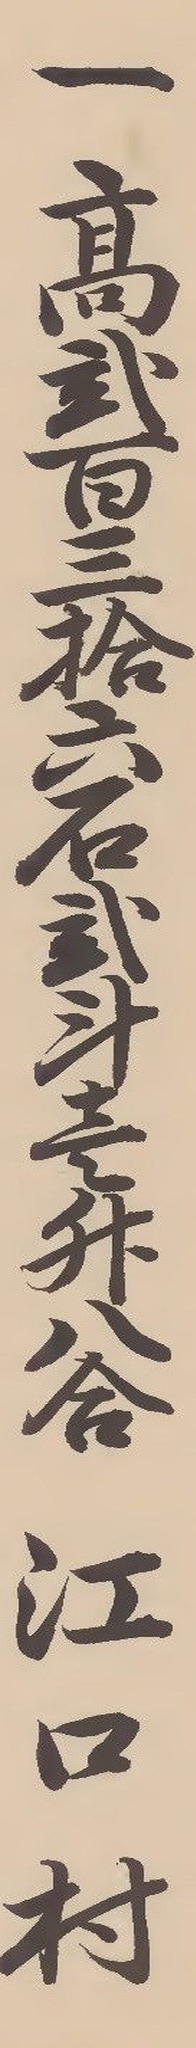一高弐百三拾六石弐斗壱升八合江口村
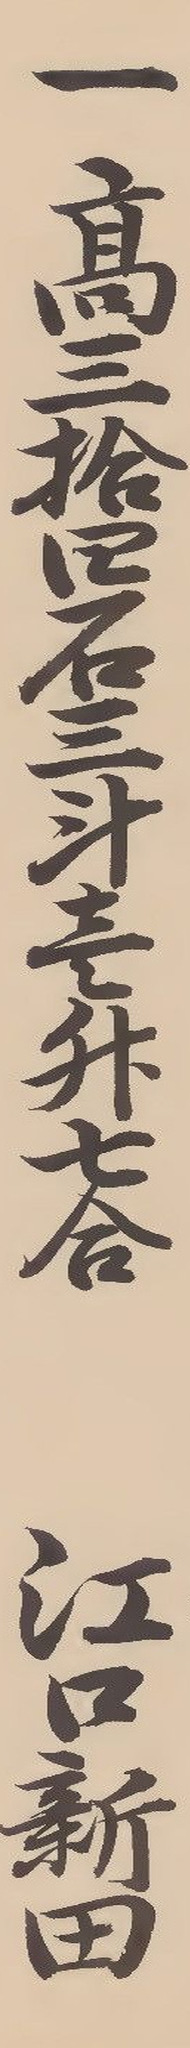一高三拾四石三斗壱升七合江口新田
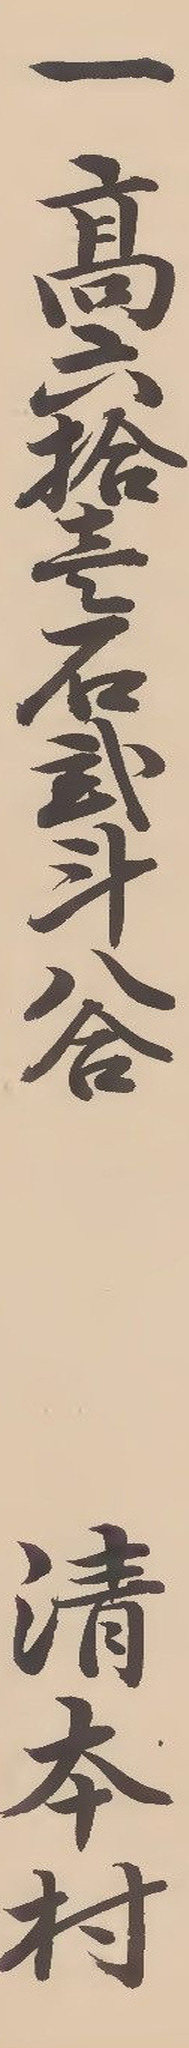一高六拾壱石弐斗八合清本村
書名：越後国郷帳　中
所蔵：国立公文書館 National Archives of Japan
